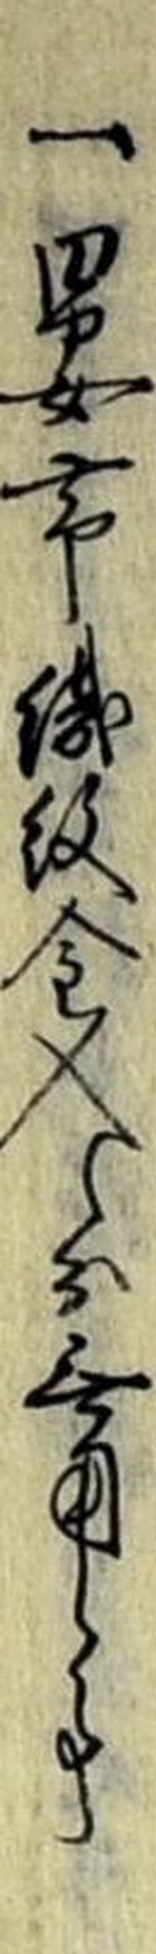一男女帯織紋金入之分無用之事
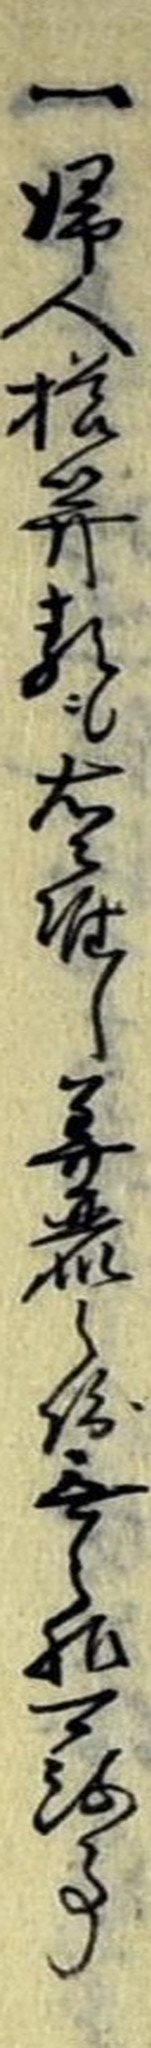一婦人櫛笄類も右ニ准し華麗之儀無之様可致事

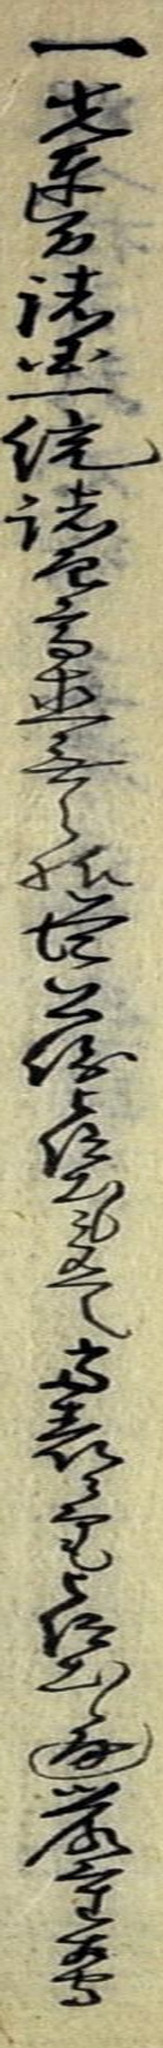一先達而諸国一統諸色高直無之様従公儀被仰出も有之当表ニ而も被仰出候通厳重相守
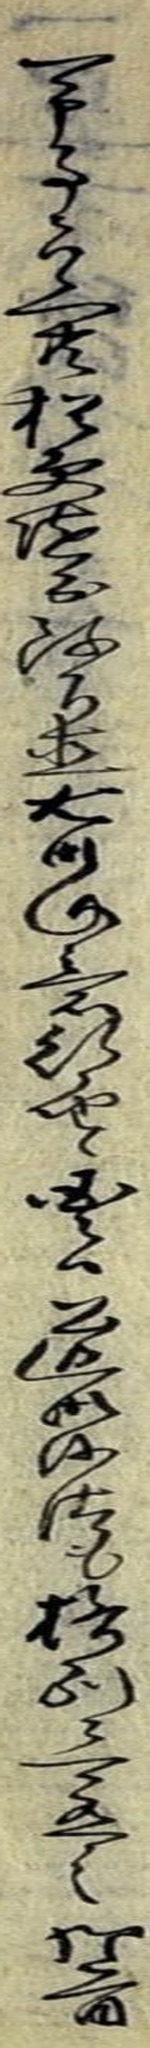可申事ニハ候へ共猶更随分致下直右御趣意行届候国ニハ公辺御沙汰も格別ニ可有之御首
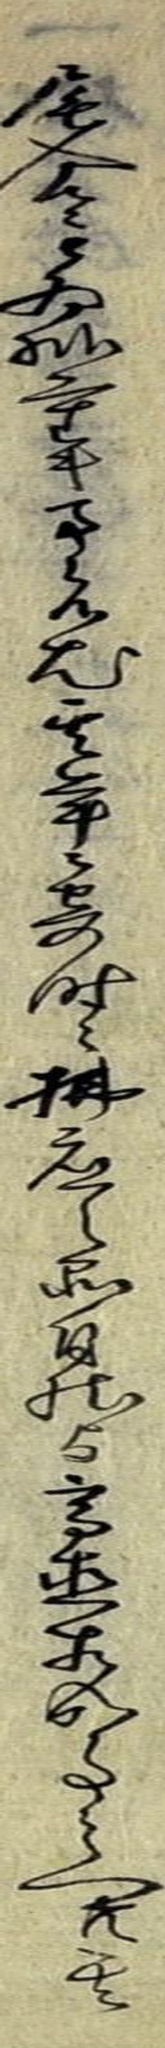尾合ニ被為掛重キ事ニ候尤其年ニ寄時々払底之品自然与高直相成事ニ候へ共其
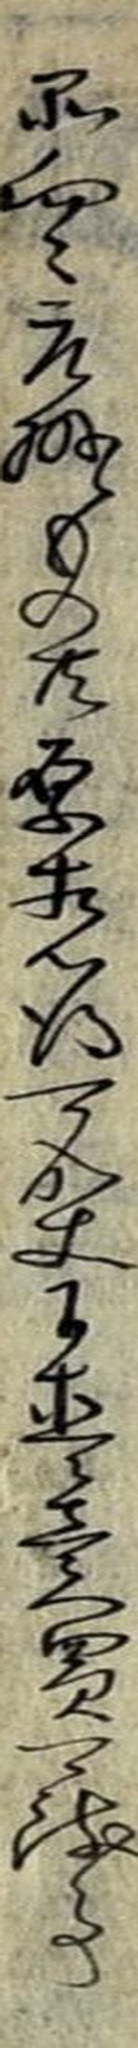品向々取扱候もの共厚相心得可成丈下直ニ売買可致事
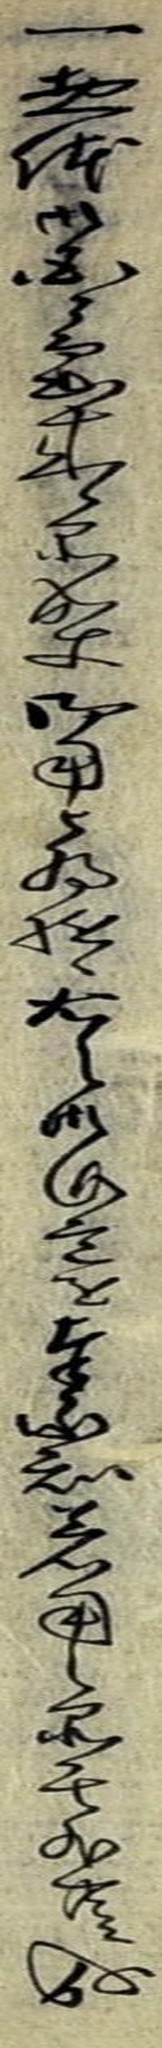一惣体御国ニ而出来候品成丈御用被為遊候右之御趣意を奉承知着用之品其外共ニ成
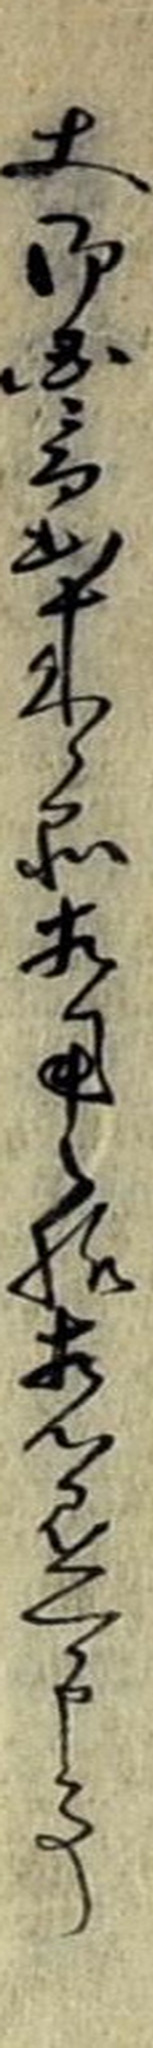丈御国ニ而出来候品相用候様相心懸可申事
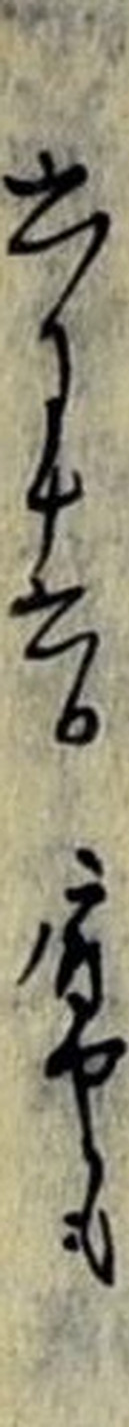六月十六日府中へも
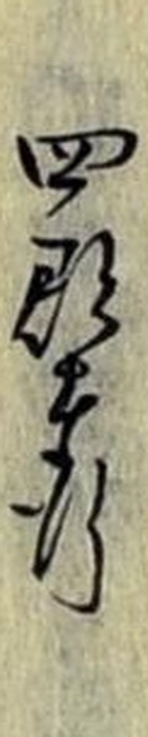四郡奉行
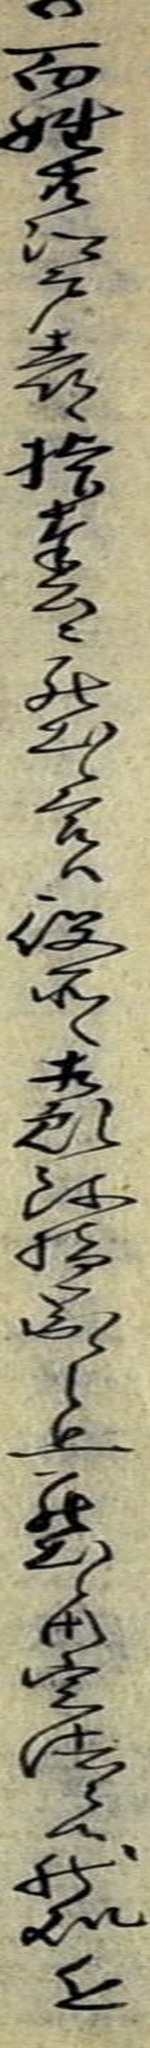〇百姓共江戸表へ挊奉公ニ罷出候節ハ役所へ相願致指図之上罷出候御定法ニ候然処近
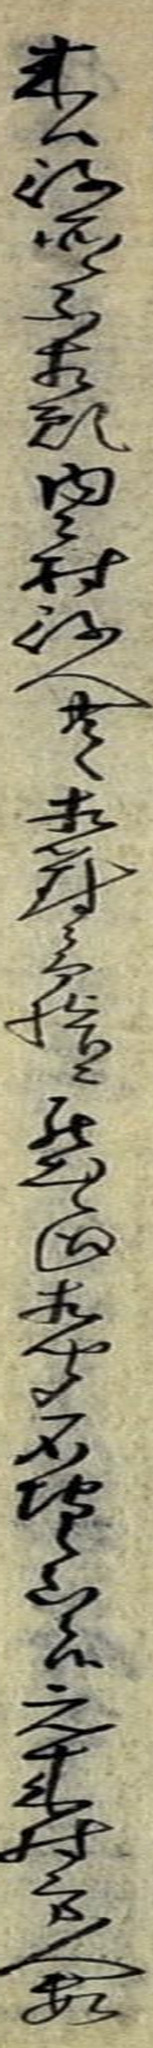来ハ役所へ不相願内々村役人共へ相対ニ而挊ニ罷出候趣相聞不埒之至ニ候元来村方人数
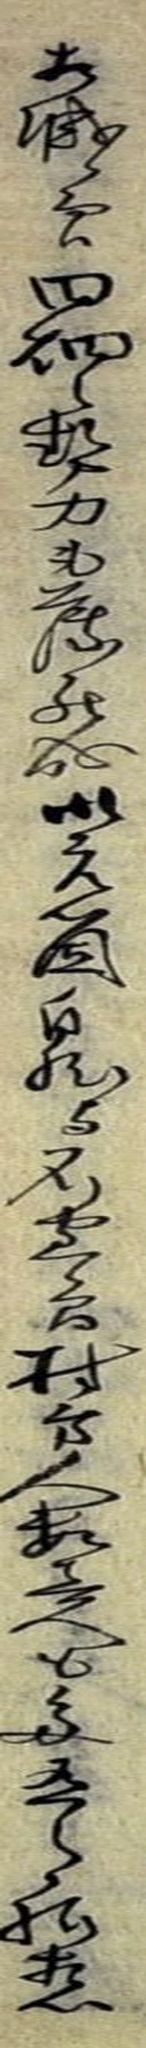相減候而ハ田畑之勢力も薄罷成御取箇自然与不宜候間村方人数壱人も多有之候様相心
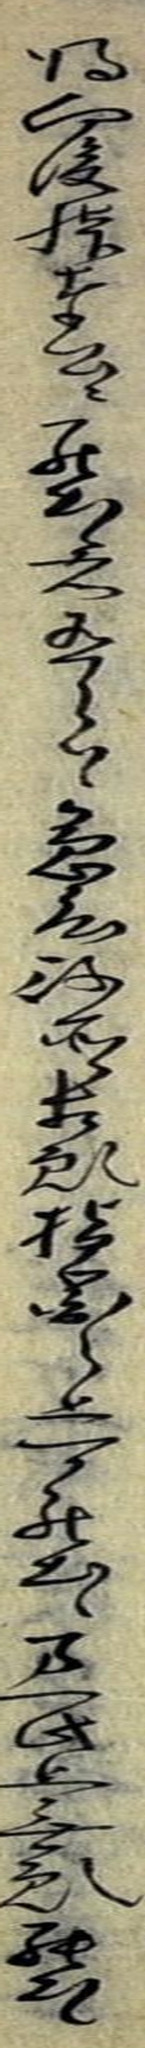得向後挊奉公ニ罷出候者有之候ハヽ急度役所へ相願指図之上可罷出候万一此上無願罷出候
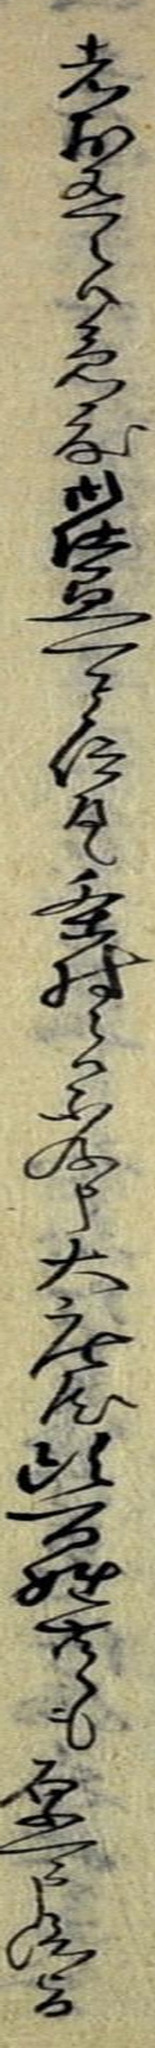者於有之ハ急度御仕置可被仰付候条村々ハ不及申大庄屋頭百姓共へも厚可
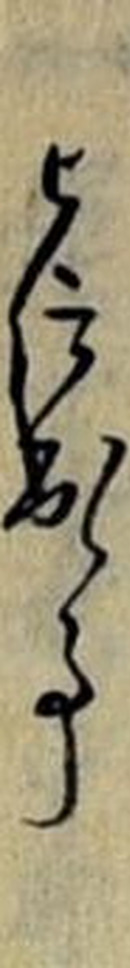被仰出候事
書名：命令之部 三
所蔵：福井県文書館 Fukui Prefectural Archives
